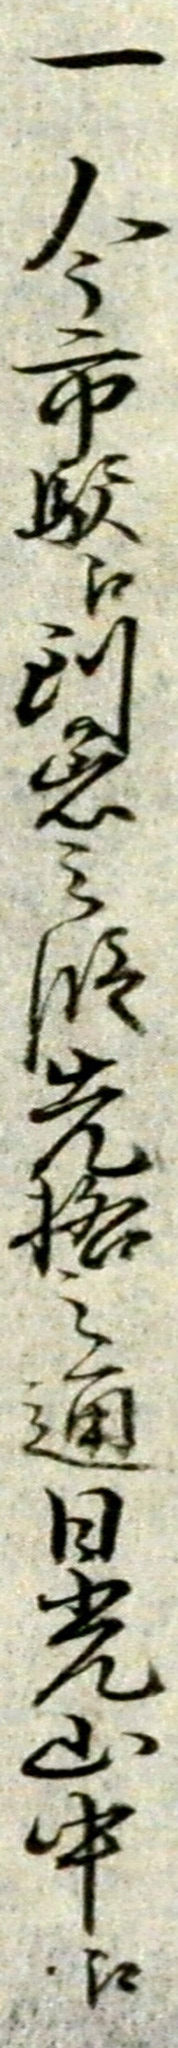一今市駅江到着之段先格之通日光山中江
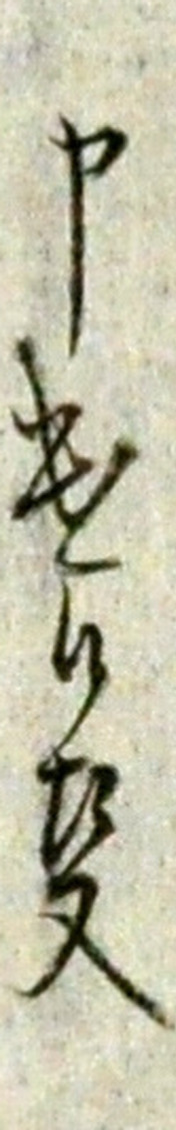申遣候叓
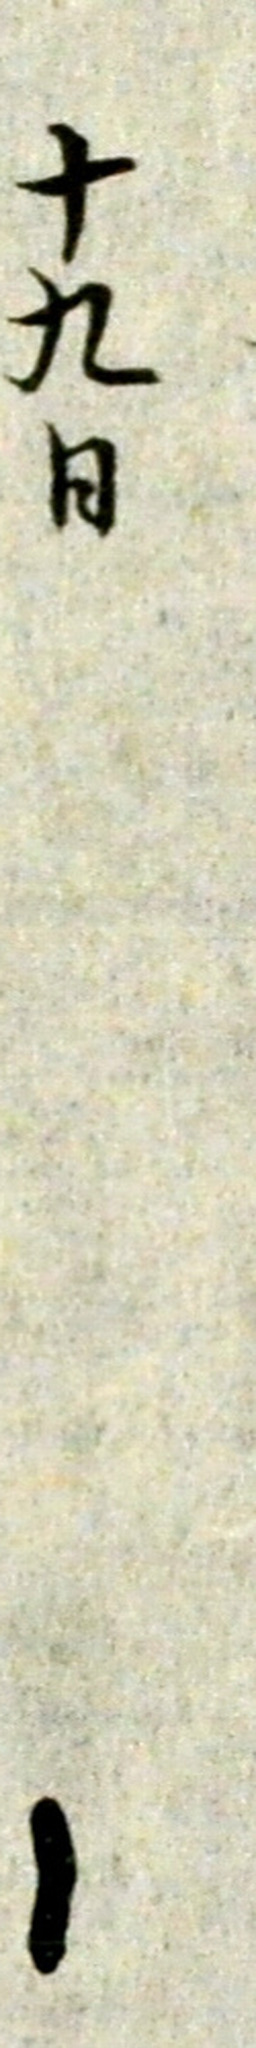十九日
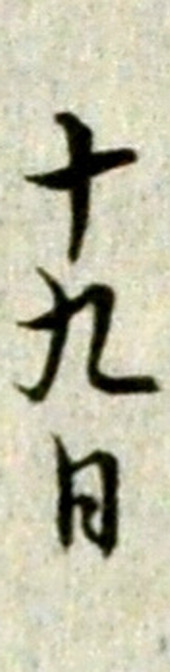十九日
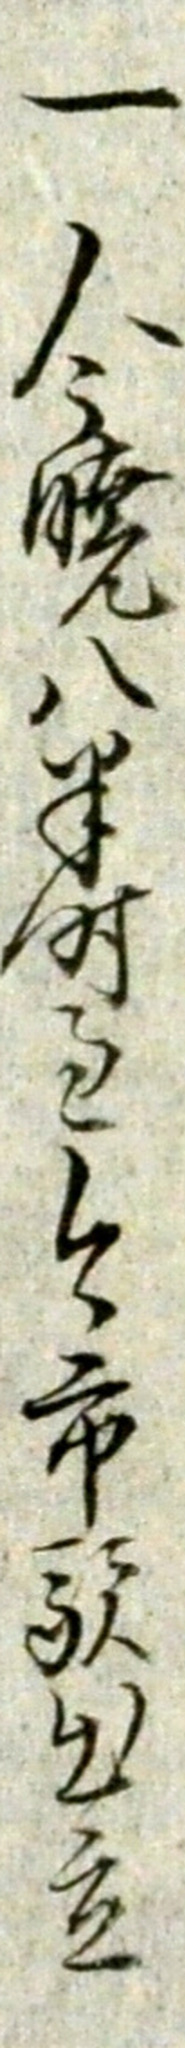一今暁八半時過今市駅出立
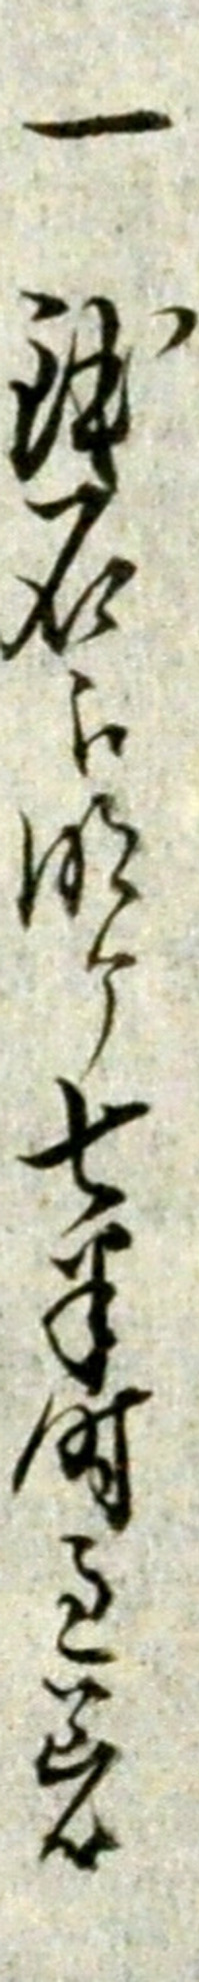一鉢石江明ケ七半時過着
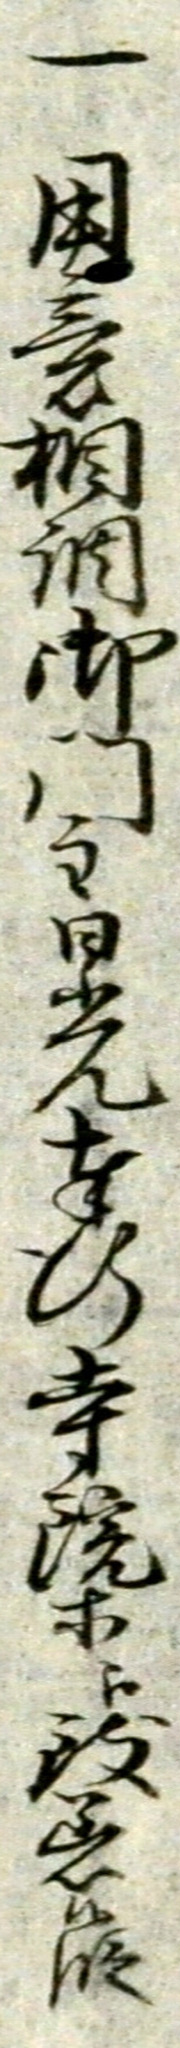一用意相調御門主日光奉行寺院等江致着候段
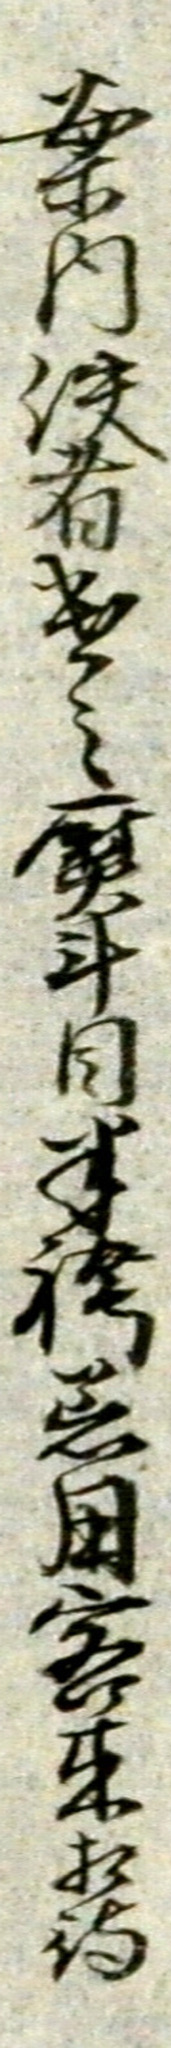案内使者遣之熨斗目半袴着用客来相待
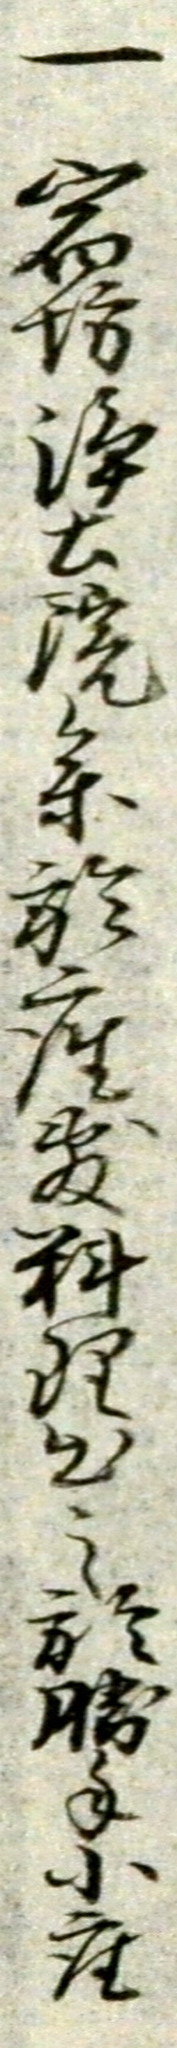一宿坊浄土院参於座敷料理出之於勝手小座
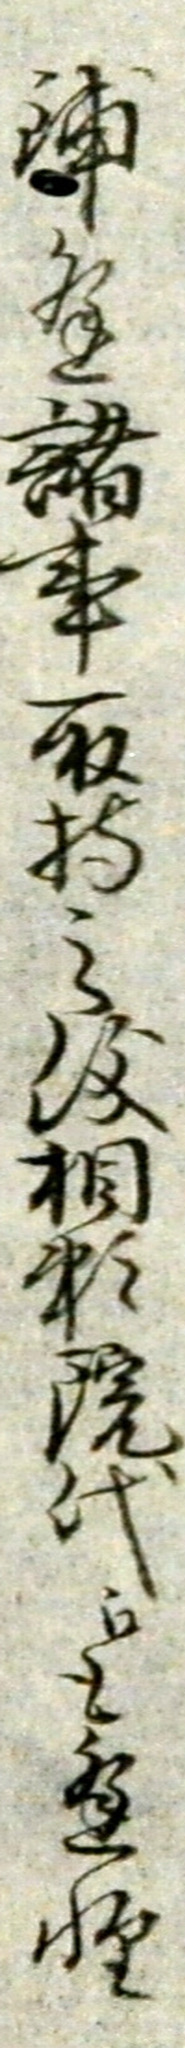鋪逢諸事取持之儀相頼院代江も逢軽
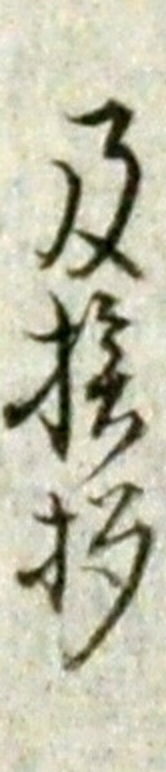及挨拶

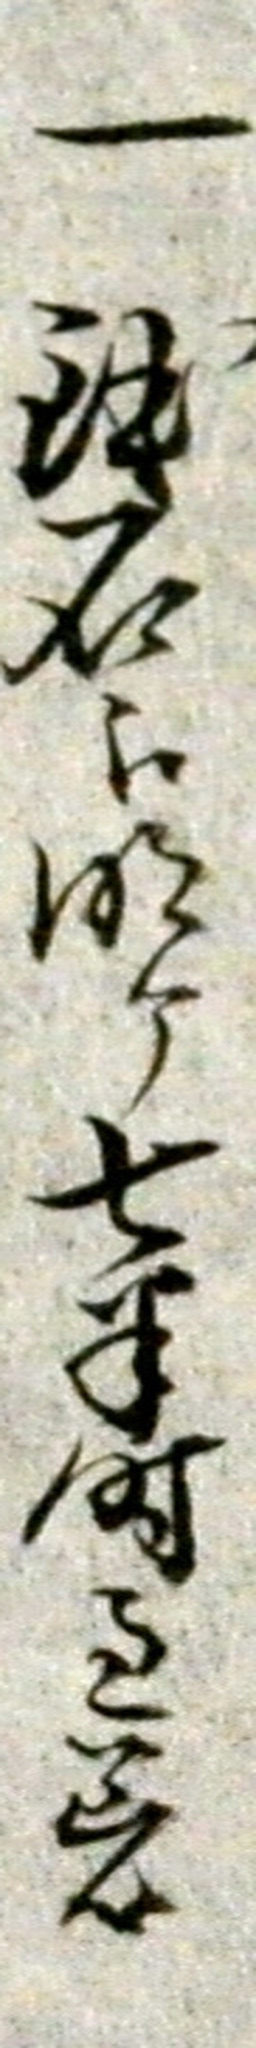一鉢石江明ヶ七半時過着
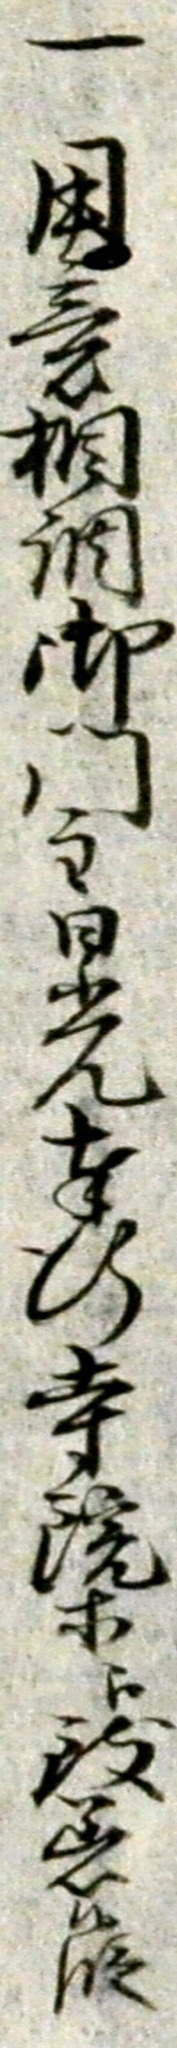一用意相伺御門主日光奉行寺院等江致着候段
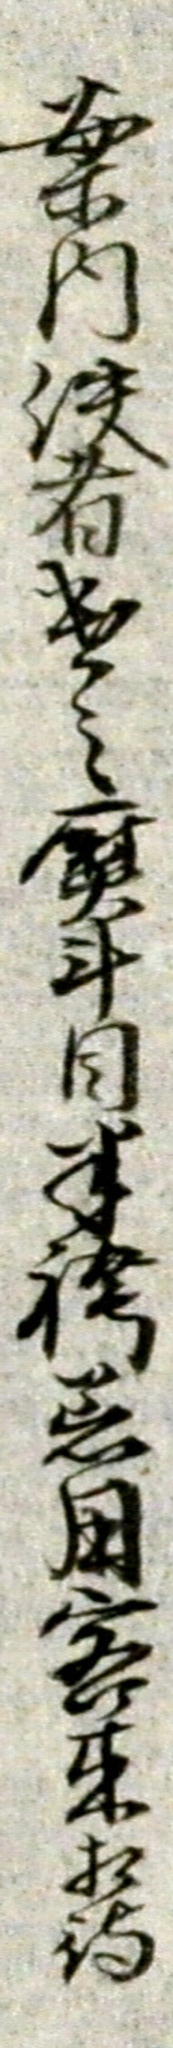案内使者遣之熨斗目半袴着用客来相待
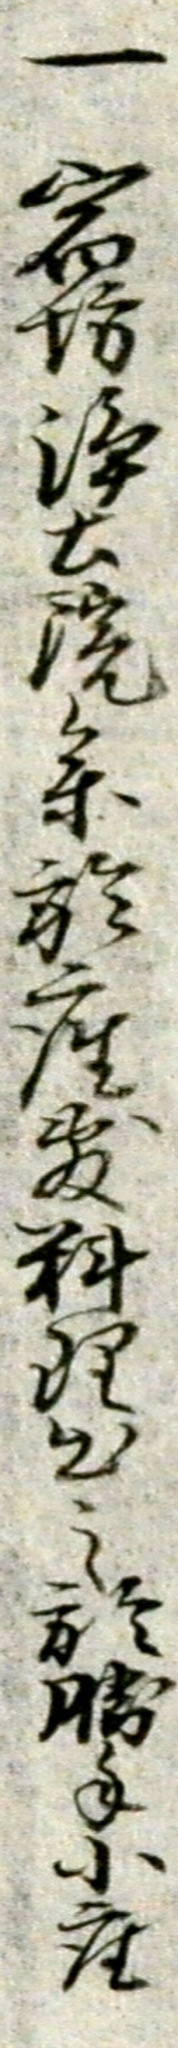一宿坊浄土院参於座敷料理出之於勝手小座
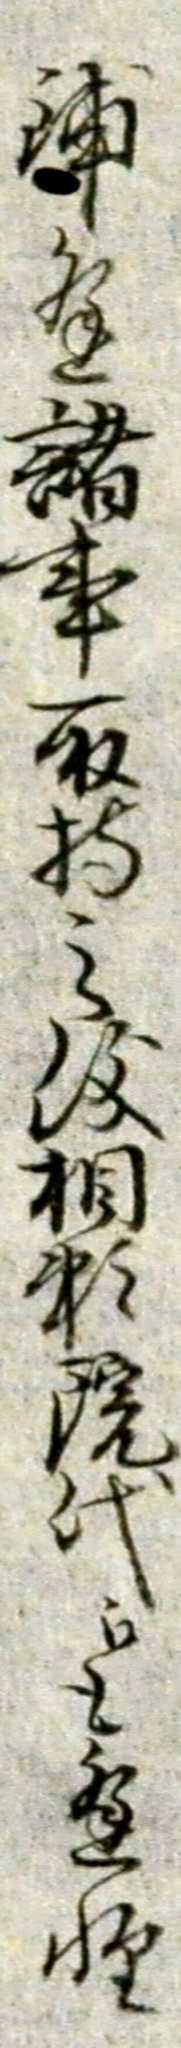鋪逢諸事取持之儀相頼院代江も逢軽
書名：日光御名代相勤候節ノ留
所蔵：伊那市立高遠町図書館・合同会社AMANE
